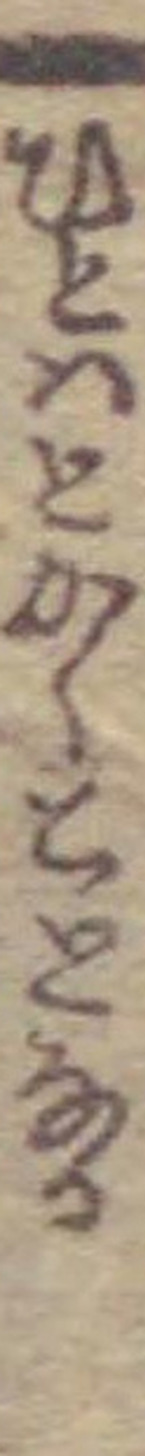ひとはとかくことなる
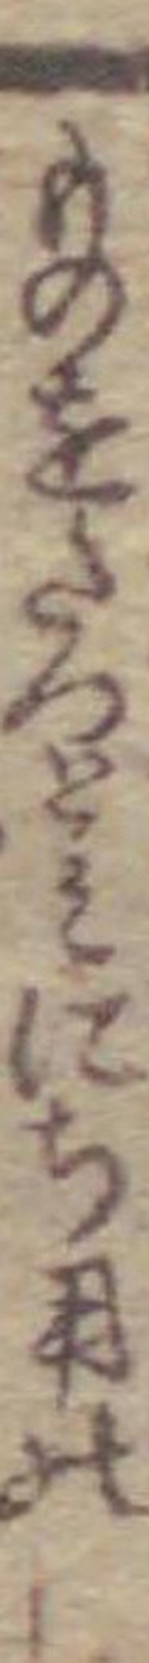ものをたつとみにち用の
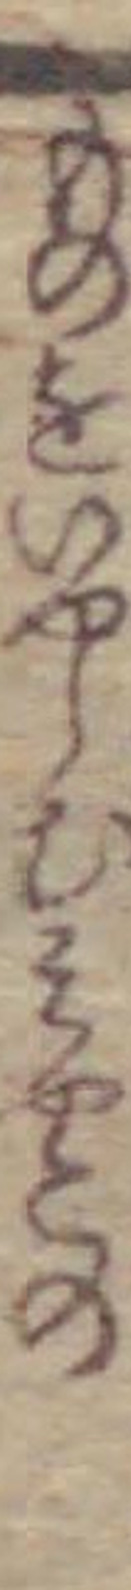ものをいやしむみやこの
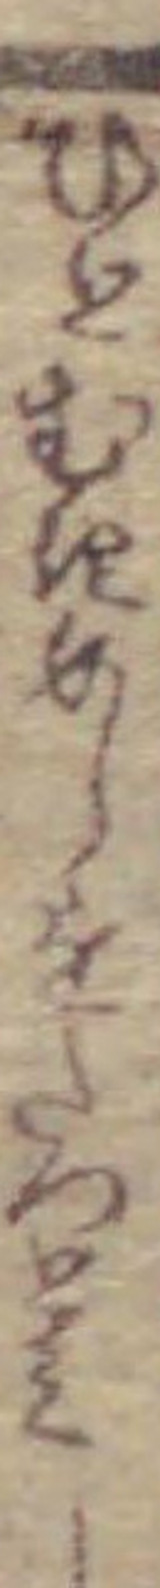ひとむきめしをたつとみ
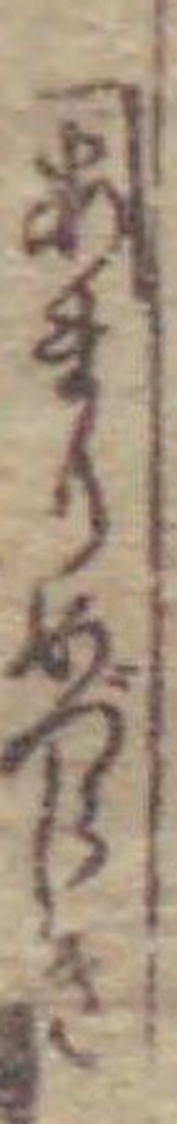〽あまりめづらしき
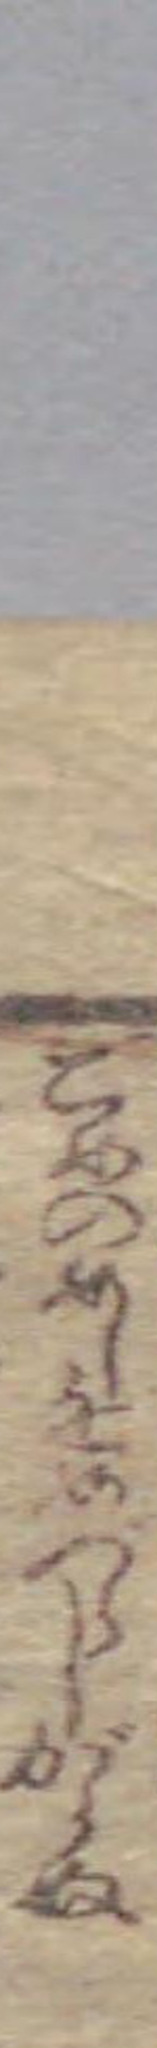こめのめしをめづらしがらぬ
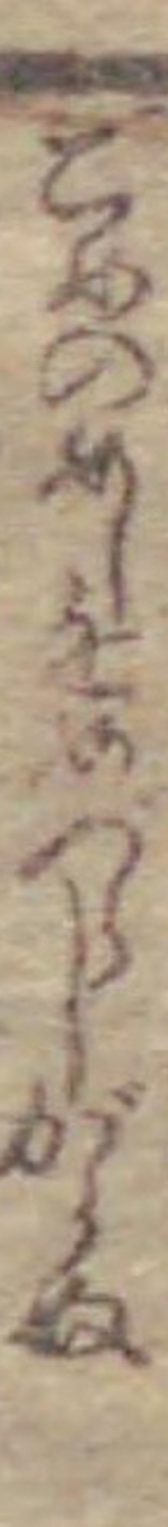こめのめしをめづらしがらぬ
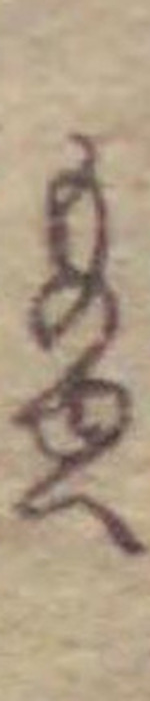ものゆへ
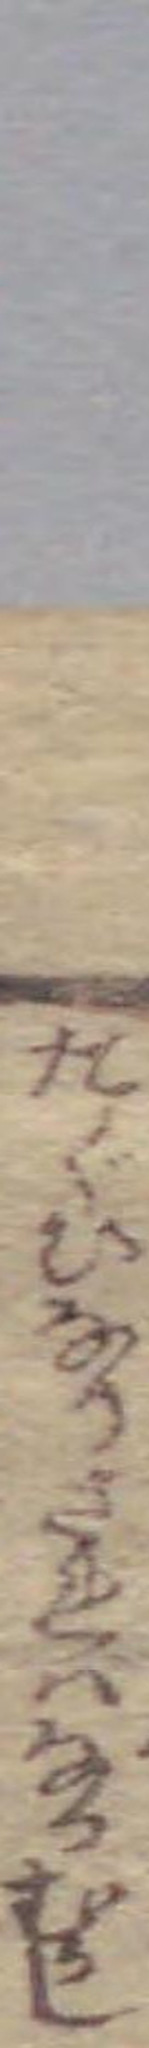たぐいなりさればなかむかし
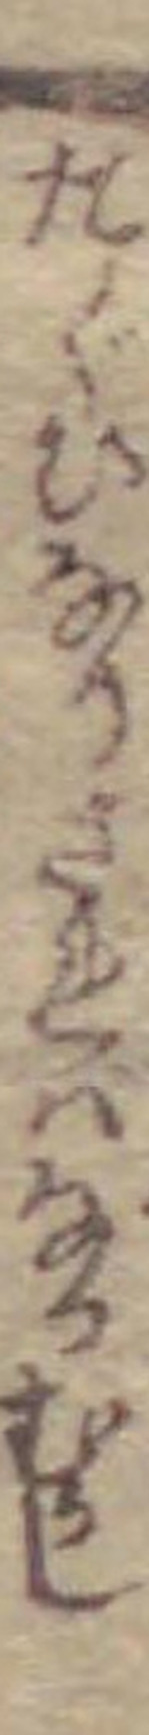たぐいなりさればなかむかし
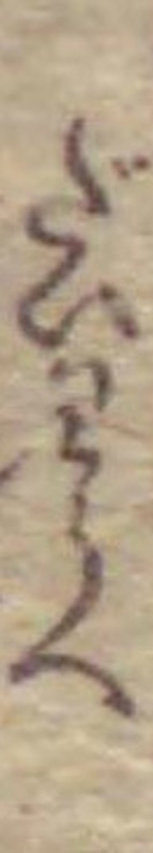だいわうへ
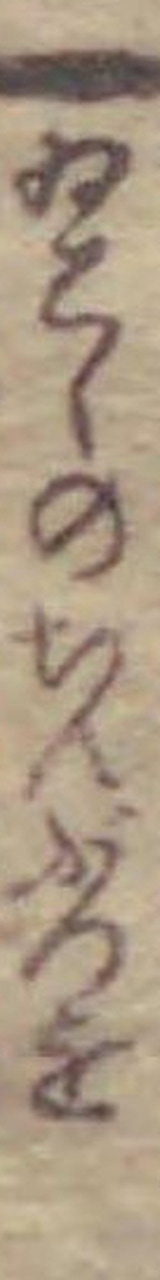ゐこくのちんぶつを
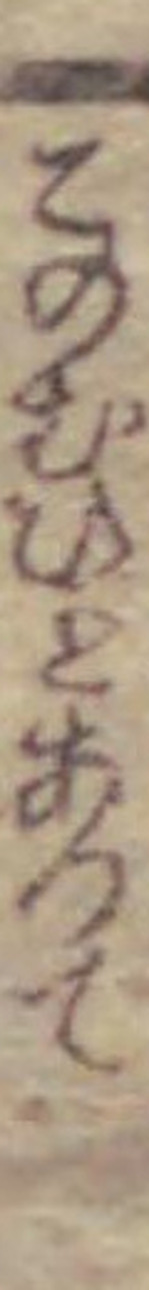このむひとあつて
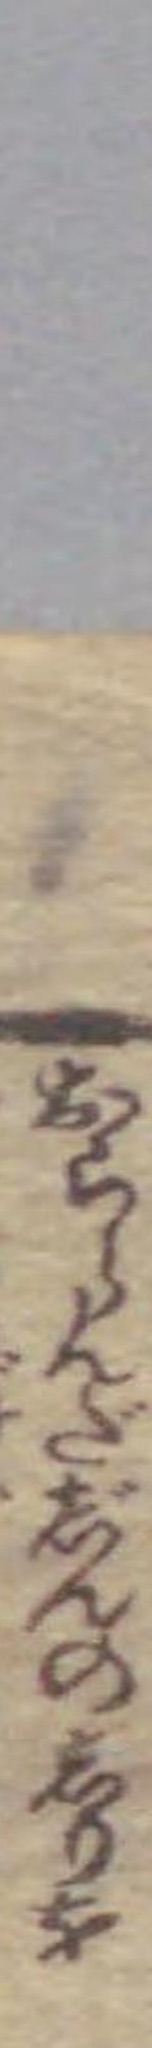おらんだじんのしりを
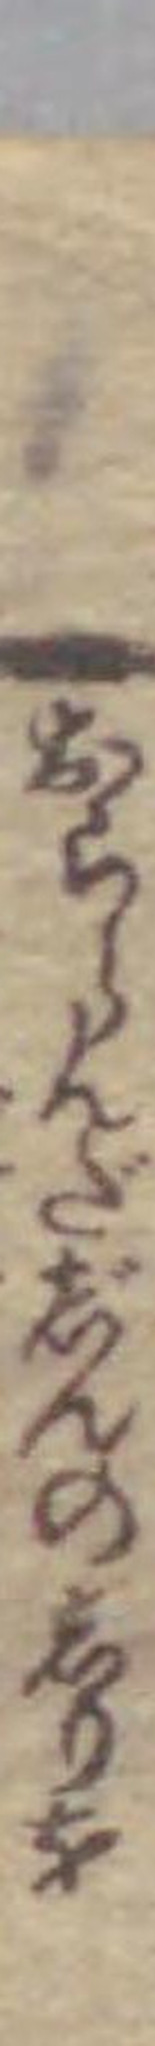おらんだじんのしりを
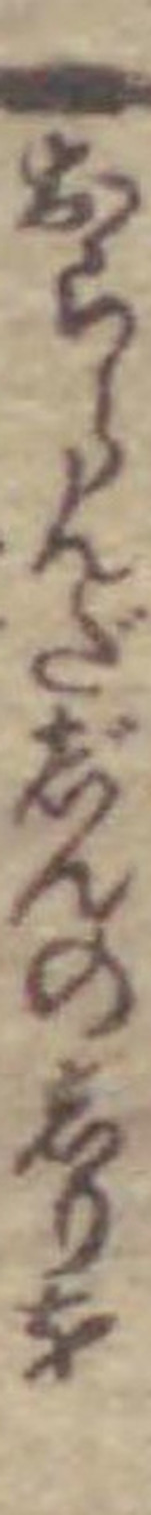おらんだじんのしりを
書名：化物和本草 : 3巻
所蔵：国立国会図書館 National Diet Library, JAPAN
